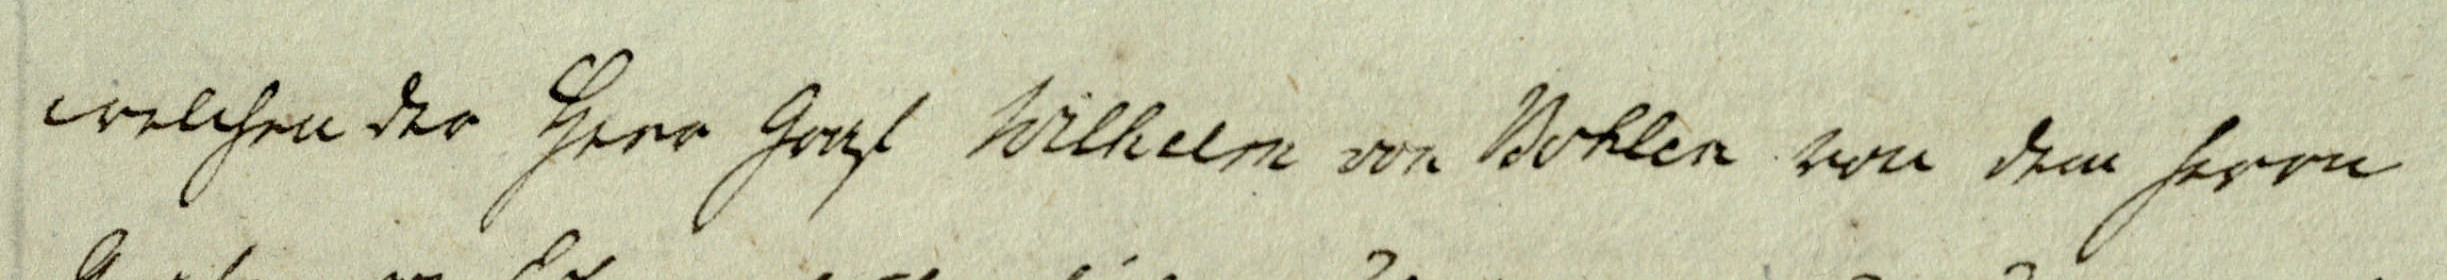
welchen der Herr Graf Wilhelm von Bohlen von dem Herrn
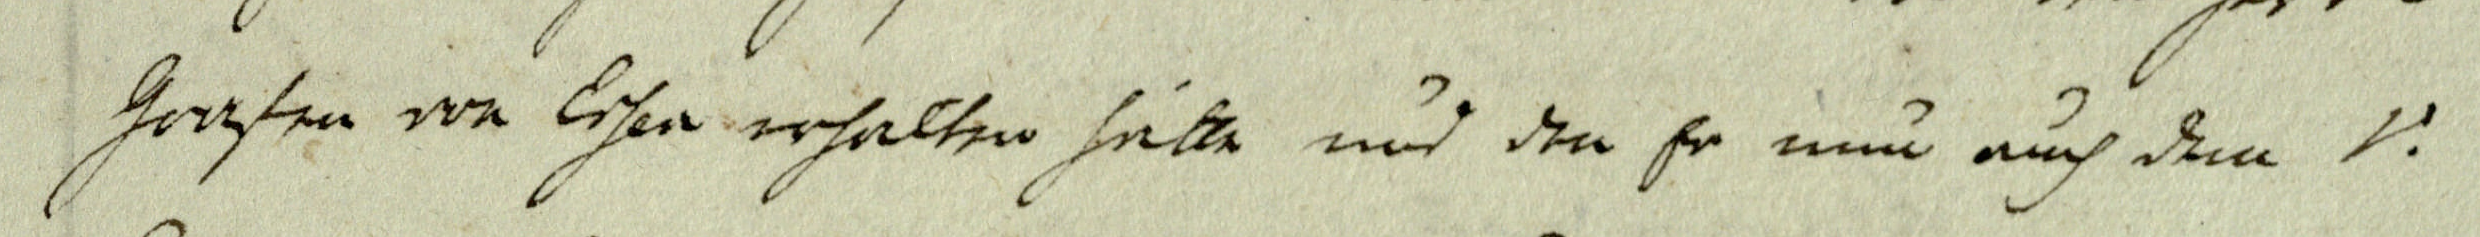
Grafen von Essen erhalten hätte und den Er nun auch dem V.
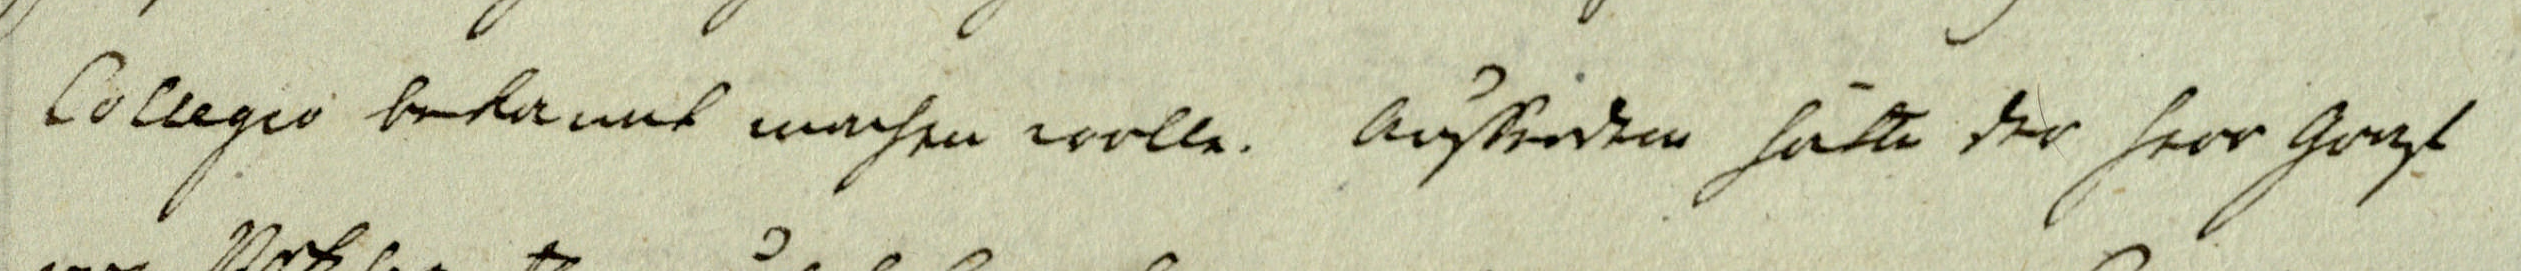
Collegio bekannt machen wolle. Ausserdem hätte der Herr Graf
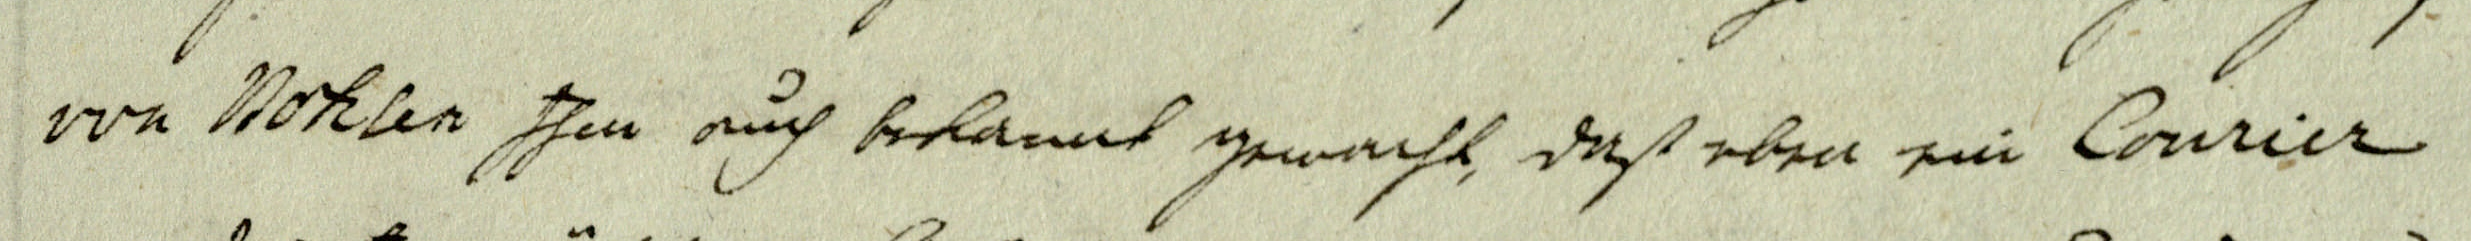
von Bohlen Ihm auch bekannt gemacht, daß eben ein Courier
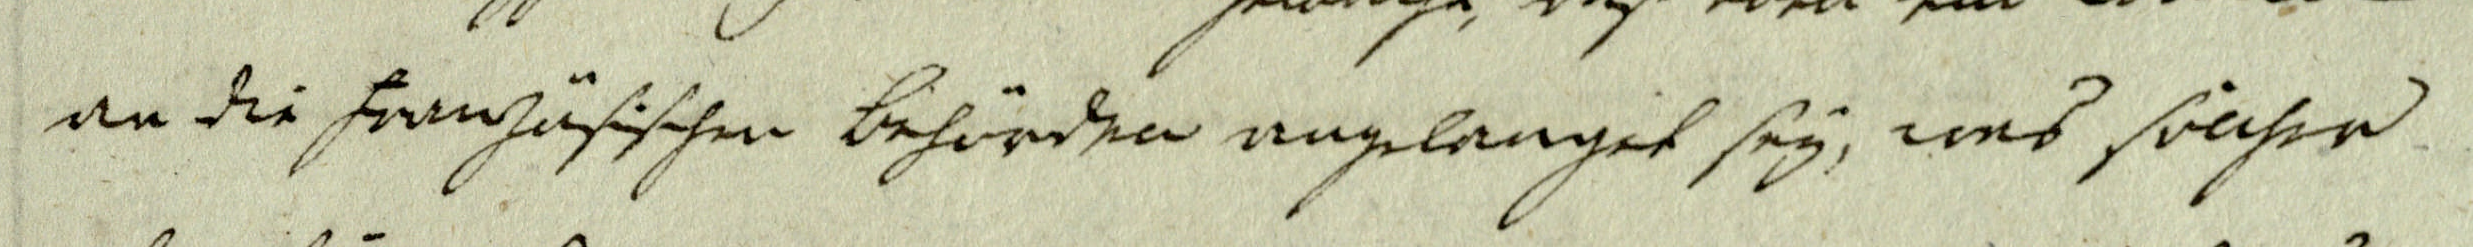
an die Französischen Behörden angelanget seÿ, was solcher
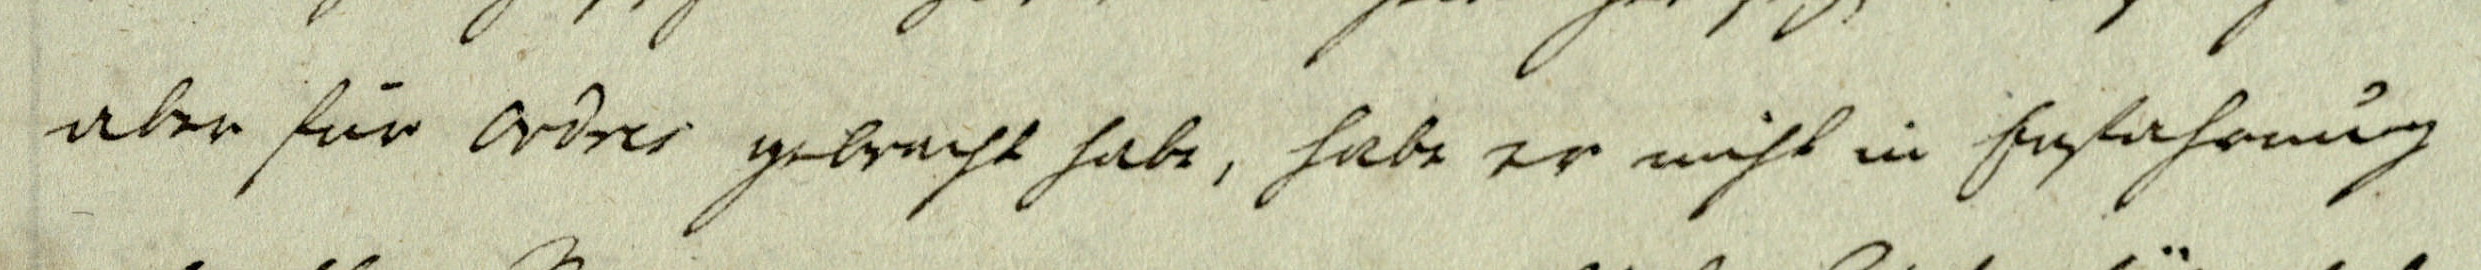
aber für Ordres gebracht habe, habe er nicht in Erfahrung
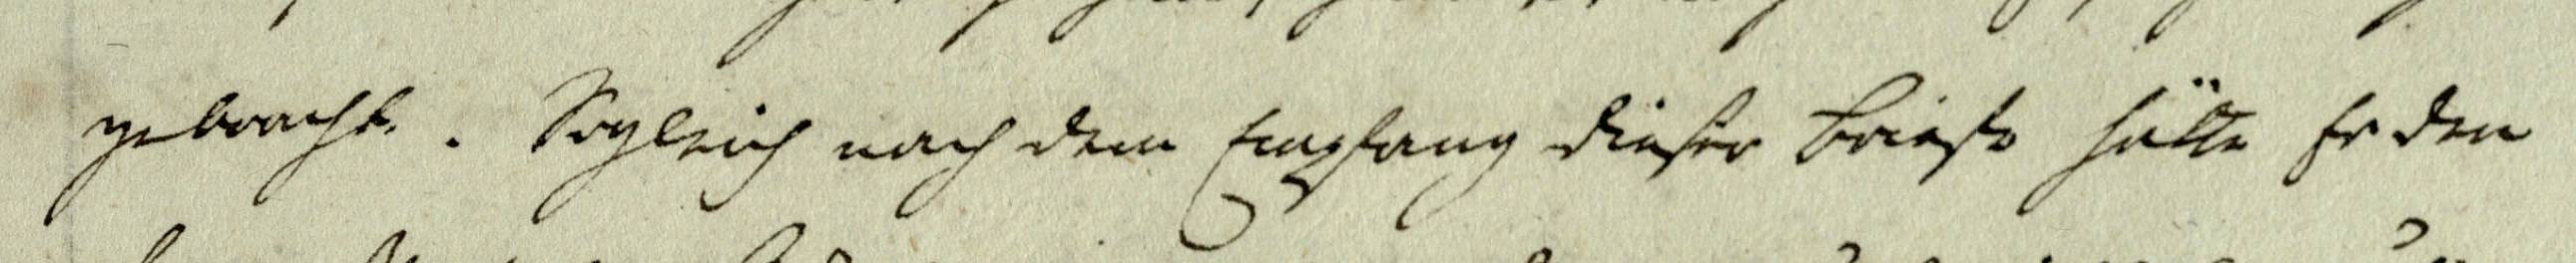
gebracht. Sogleich nach dem Empfang dieser Briefe hätte Er den
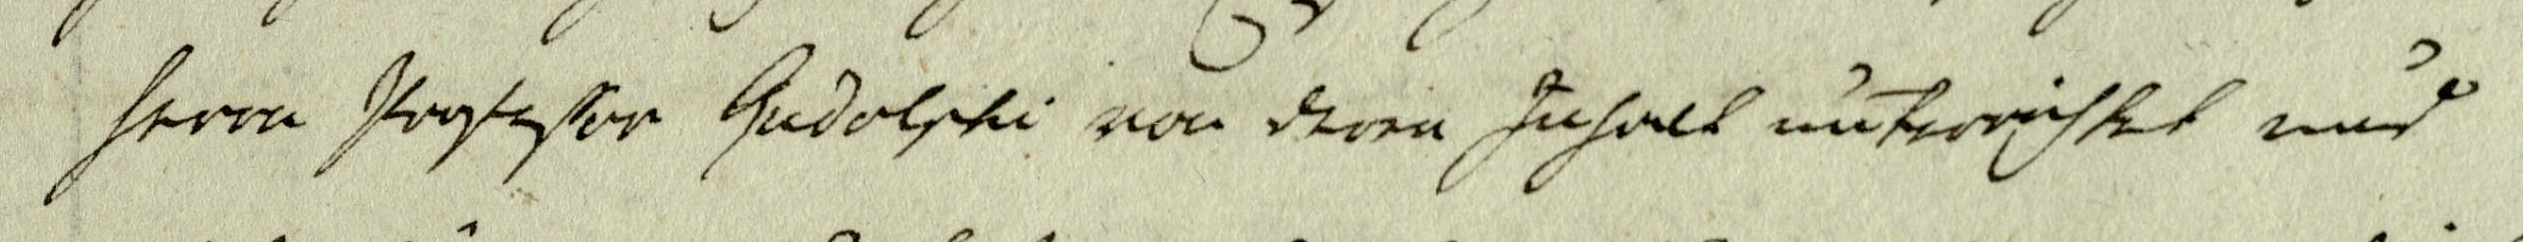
Herrn Professor Rudolphi von deren Inhalt unterrichtet und
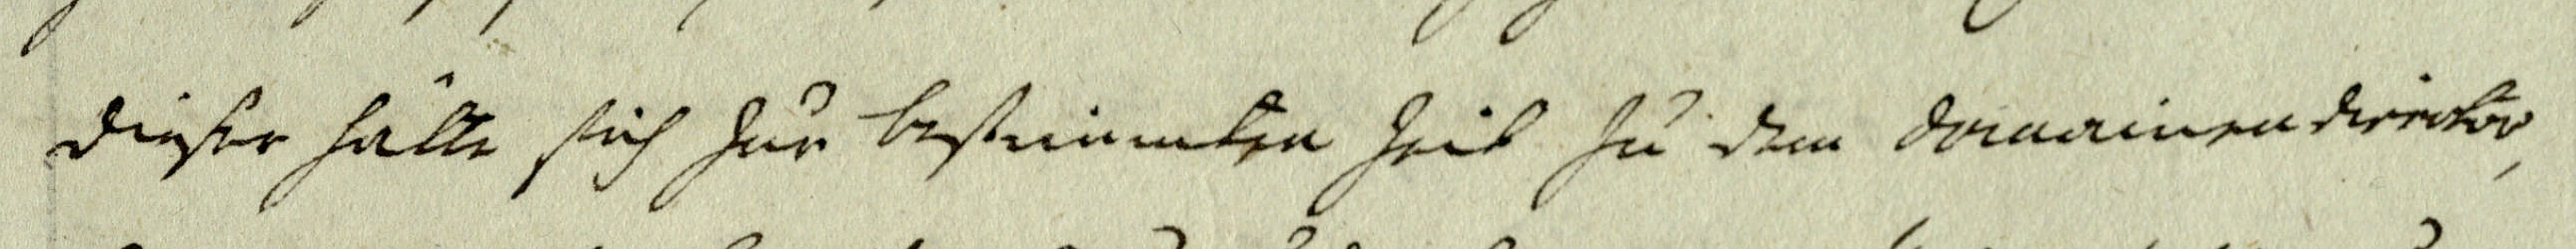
dieser hätte sich zur bestimmten Zeit zu dem Domainendirector,
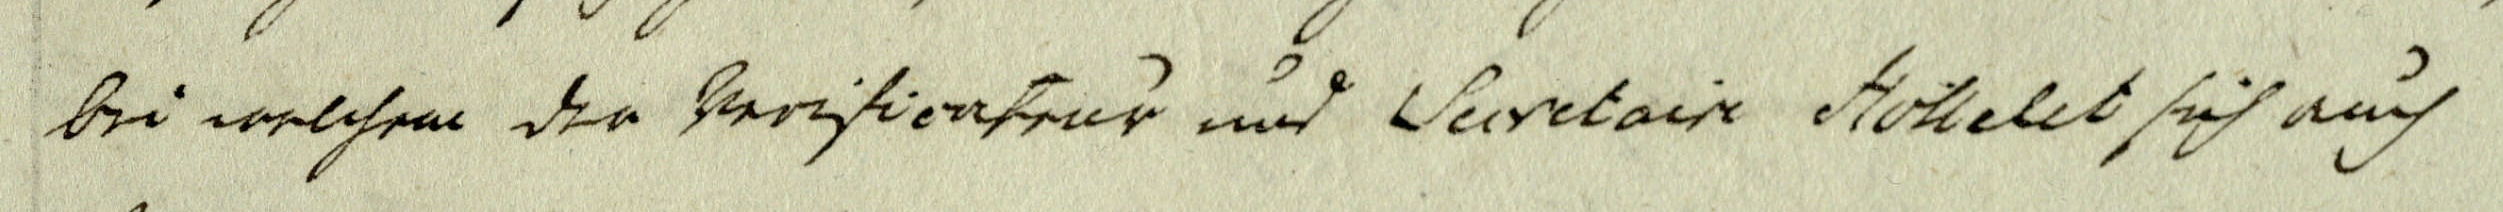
bei welchem der Verificateur und Secretaire Holletet sich auch
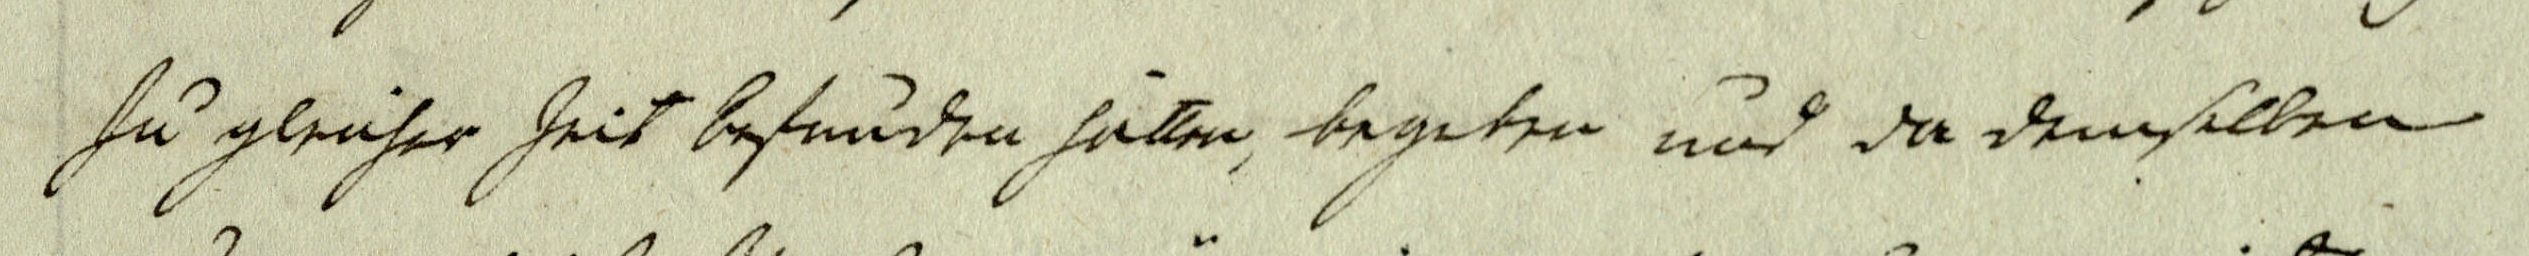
zu gleicher Zeit befunden hätten, begeben und da demselben
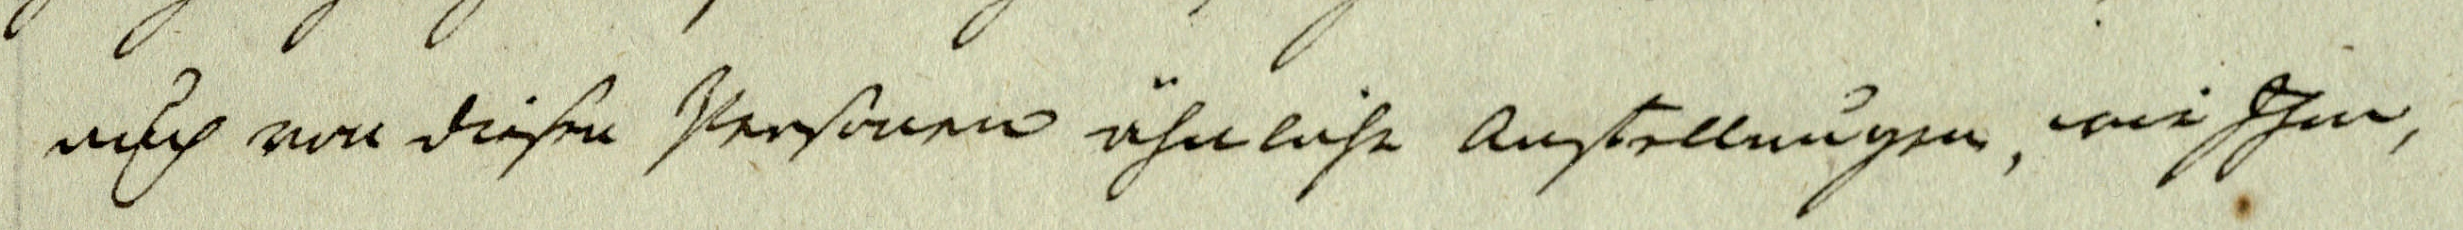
auch von diesen Personen ähnliche Anstellungen, wie Ihm,
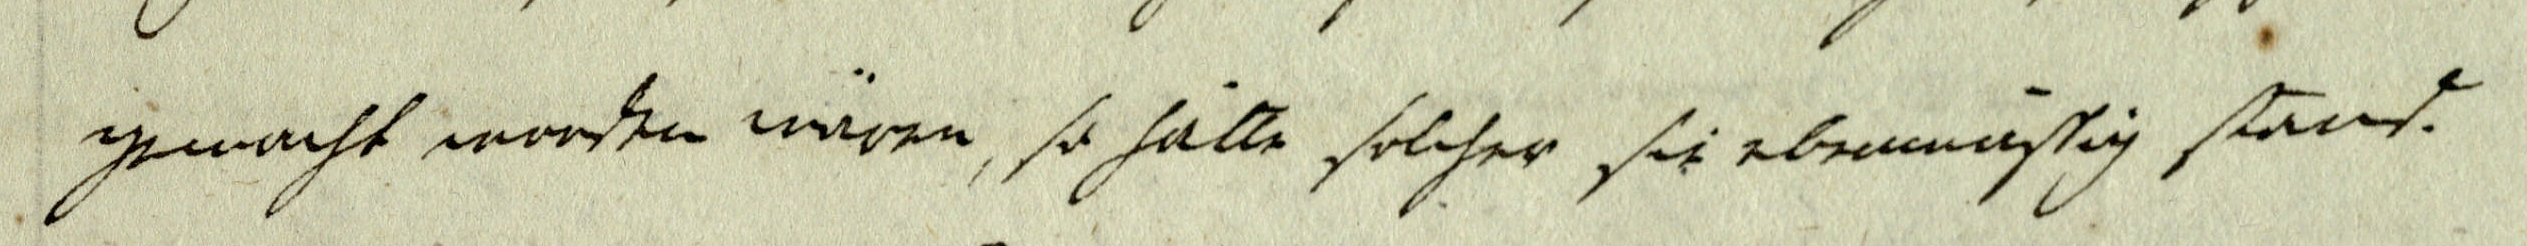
gemacht worden wären, so hätte solcher sie ebenmässig stand¬
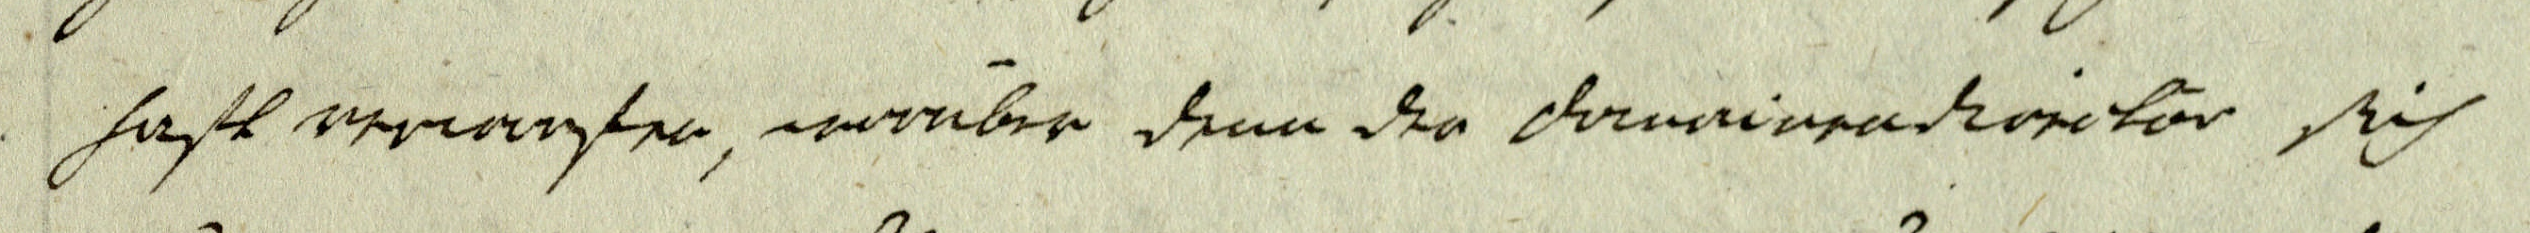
haft verworfen, worüber denn der Domainendirector sich
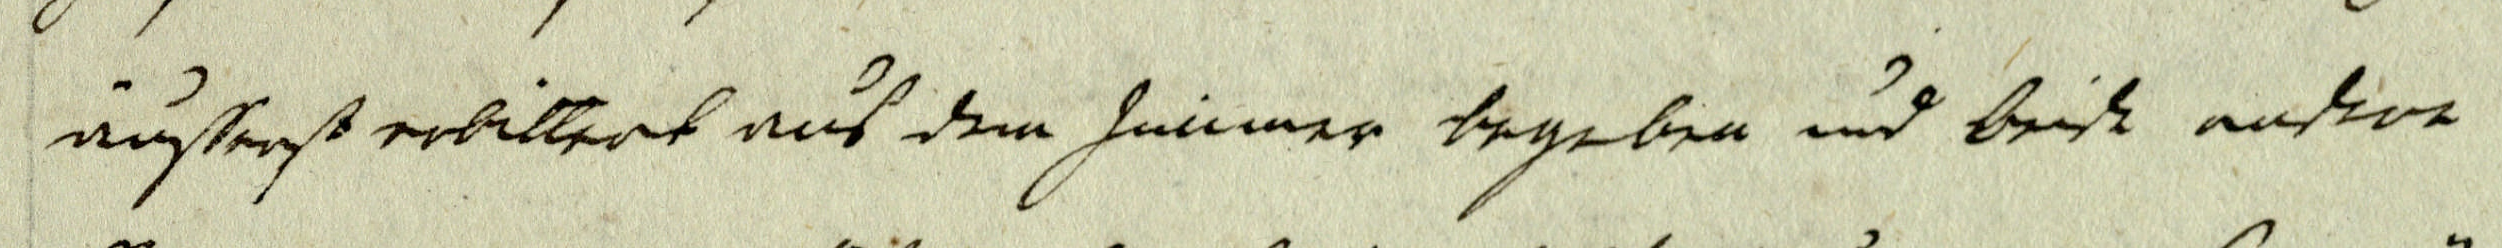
äusserst erbiltert aus dem Zimmer begeben und beide andern
